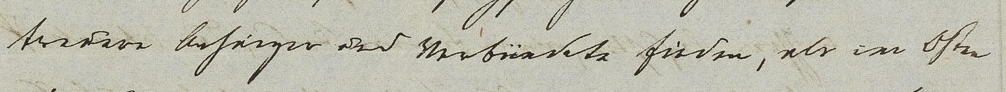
treuere Anhänger und Verbündete finden, als im Osten
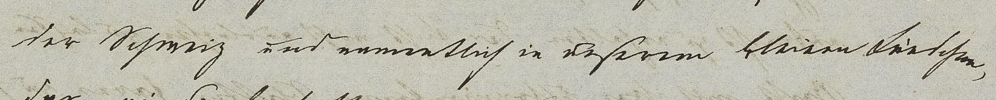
der Schweiz und namentlich in unserem kleinen Ländchen,
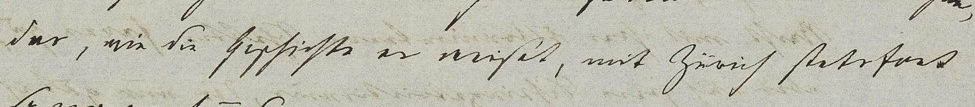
das, wie die Geschichte es weiset, mit Zürich stetsfort
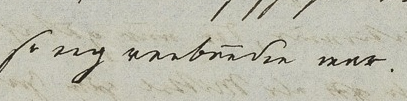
so eng verbunden war.
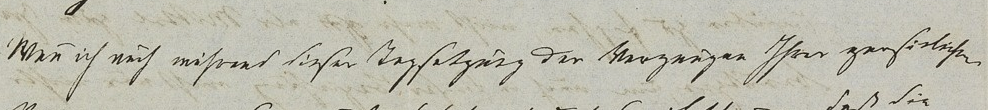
Wenn ich auch während dieser Tagsatzung das Vergnügen Ihres persönlichen
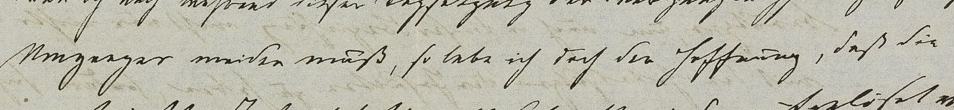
Umganges meiden muß, so lebe ich doch der Hoffnung, daß die
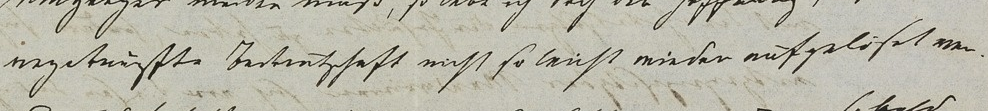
angeknüpfte Bekanntschaft nicht so leicht wieder aufgelöset wer-
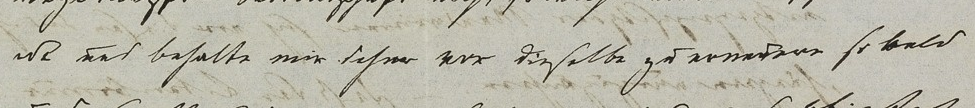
de und behalte mir daher vor dieselbe zu erneuern so bald
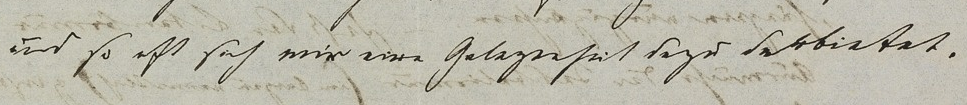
und so oft sich mir eine Gelegenheit dazu darbietet.
